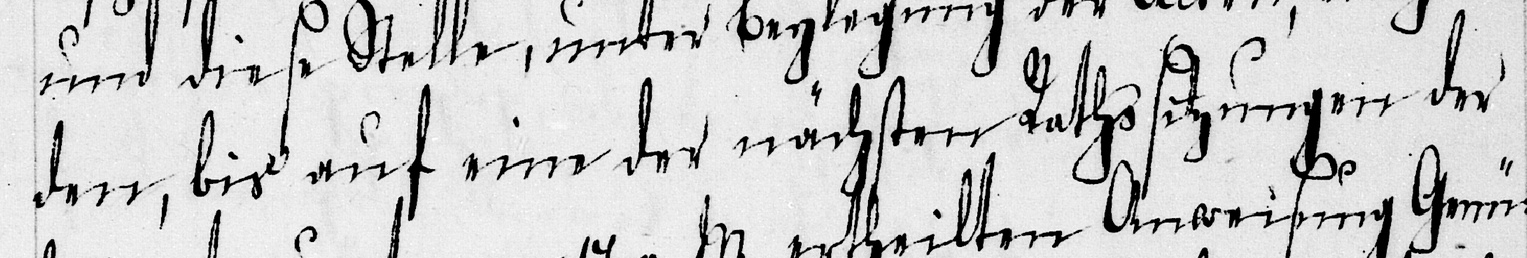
den, bis auf eine der nächsten Rathssitzungen der
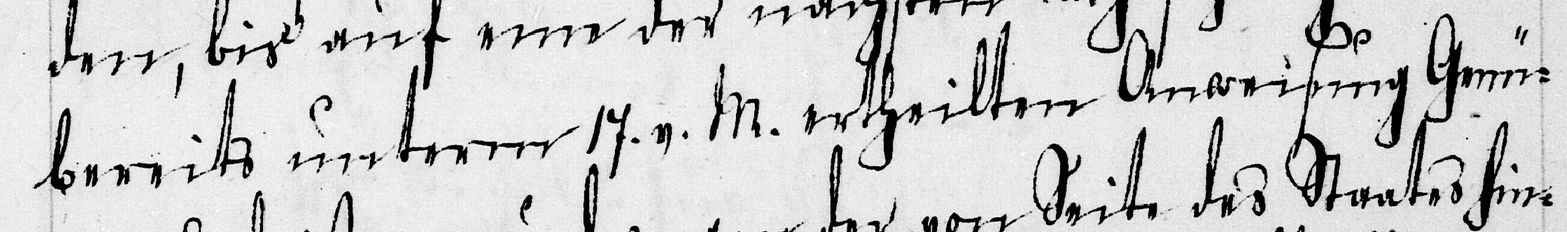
bereits unterm 17. v. M. ertheilten Anweisung Genü¬
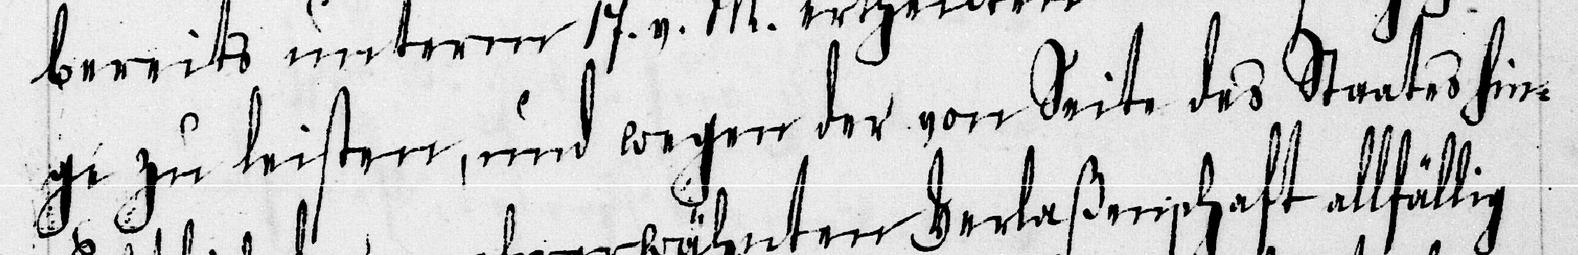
ge zu leisten, und wegen der von Seite des Staates hin¬
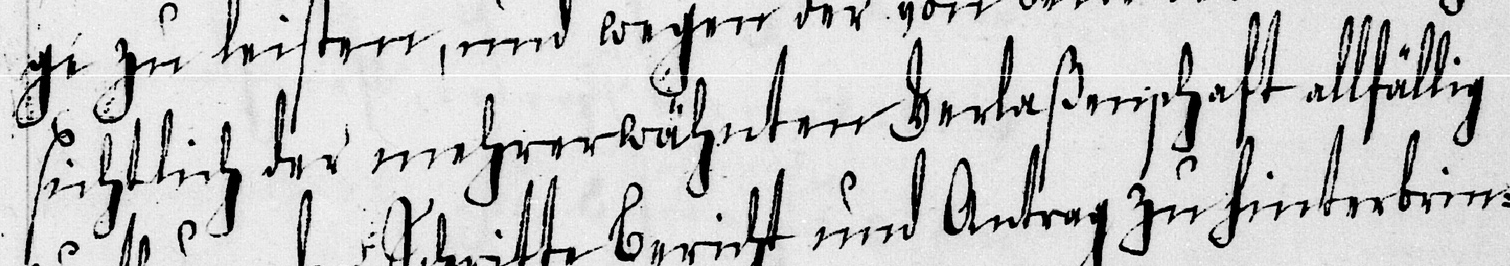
sichtlich der mehrerwähnten Verlaßenschaft allfäl¬
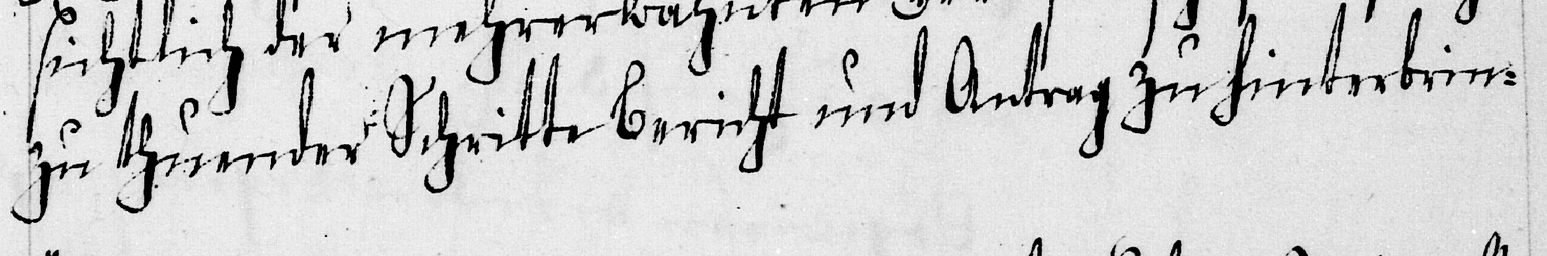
zu thuender Schritte Bericht und Antrag zu hinterbrin¬
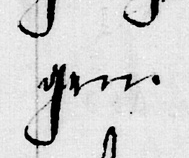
gen.
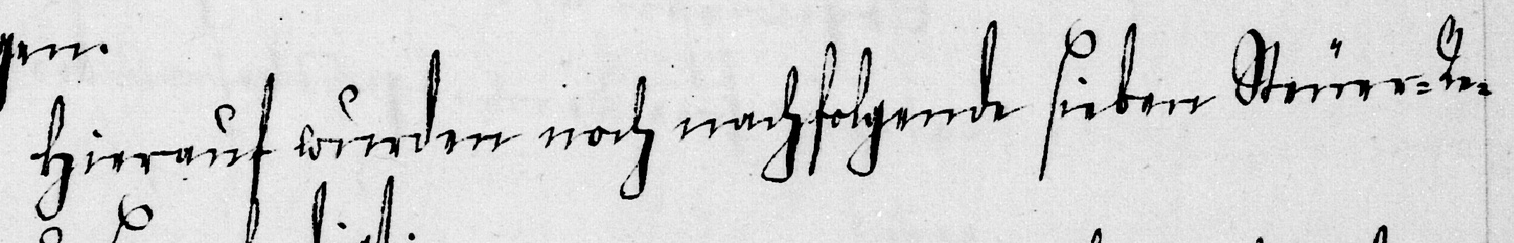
Hierauf wurden noch nachfolgende sieben Steuer-Re¬
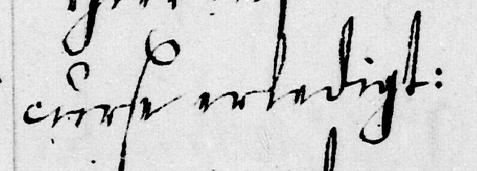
curse erledigt:
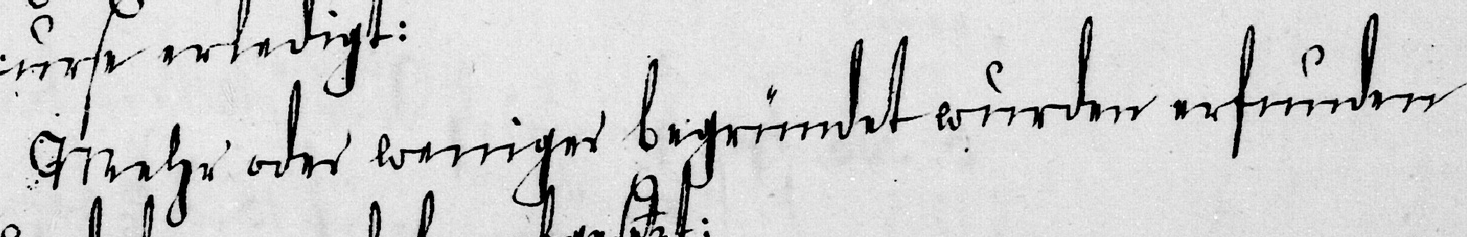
Mehr oder weniger begründet wurden erfunden
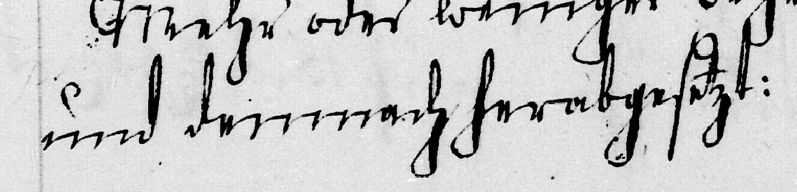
und demnach herabgesetzt:
